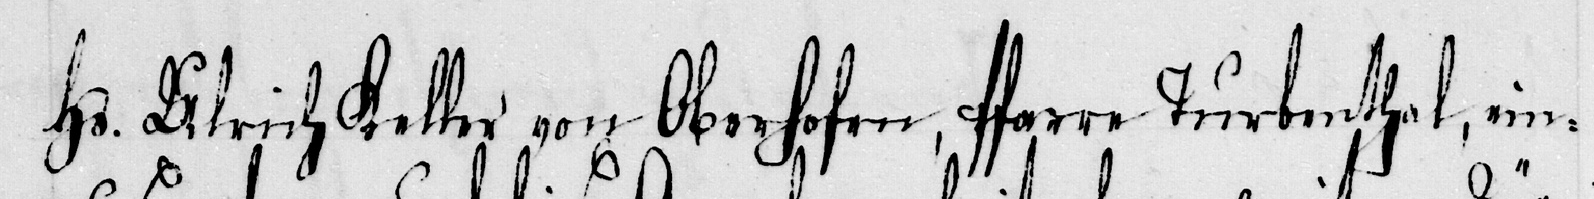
Hs. Ulrich Keller von Oberhofen, Pfarre Turbenthal, ei¬
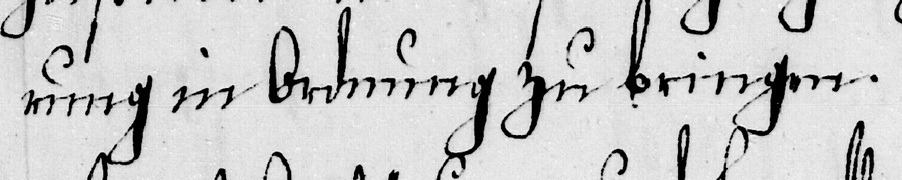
rung in Ordnung zu bringen.
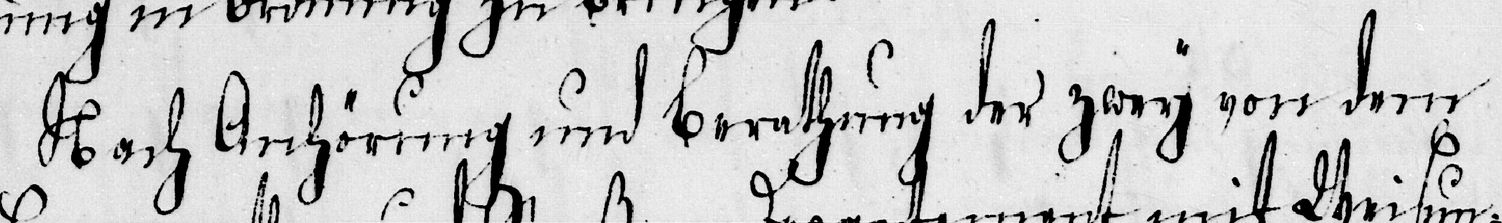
Nach Anhörung und Berathung der zwey von dem
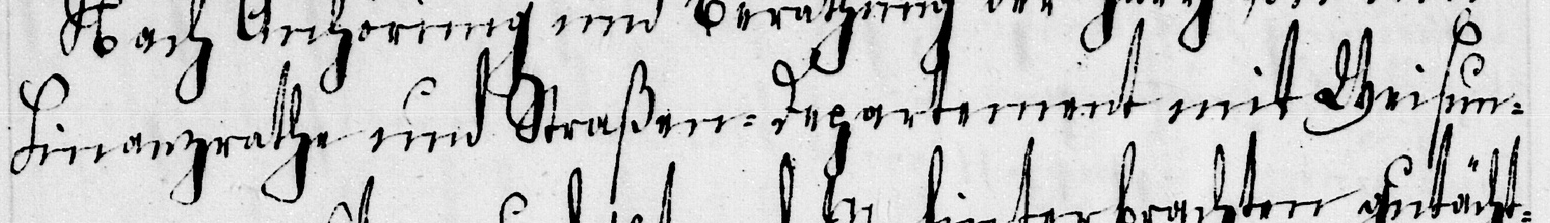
Finanzrathe und Straßen-Departement mit Weisun¬
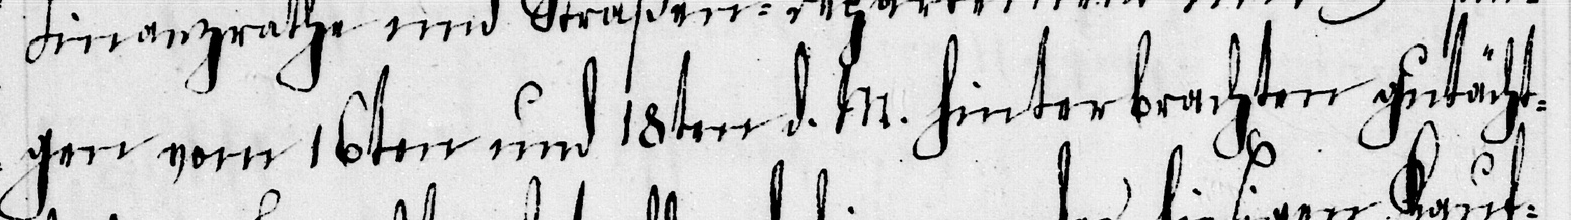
gen vom 16ten und 18ten d. M. hinterbrachten gutäch¬
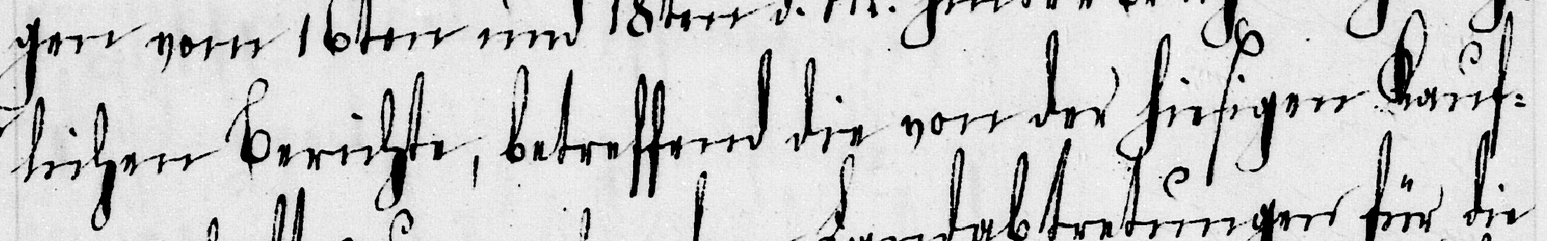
lichen Berichte, betreffend die von der hiesigen Kauf¬
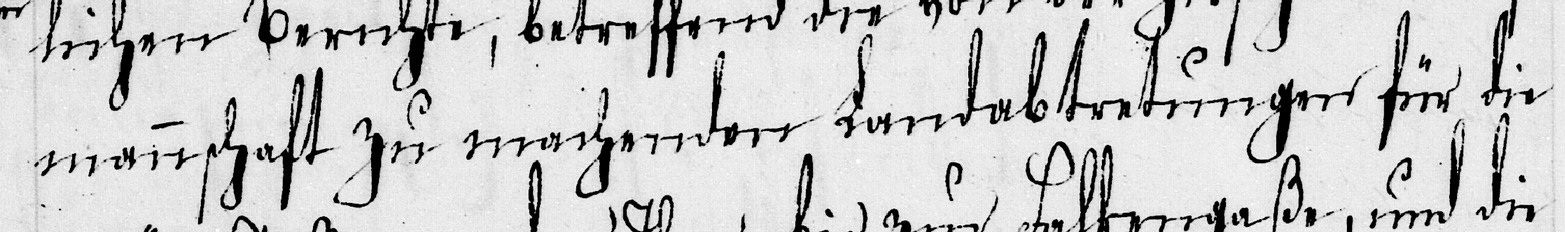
mannschaft zu machenden Landabtretungen für die
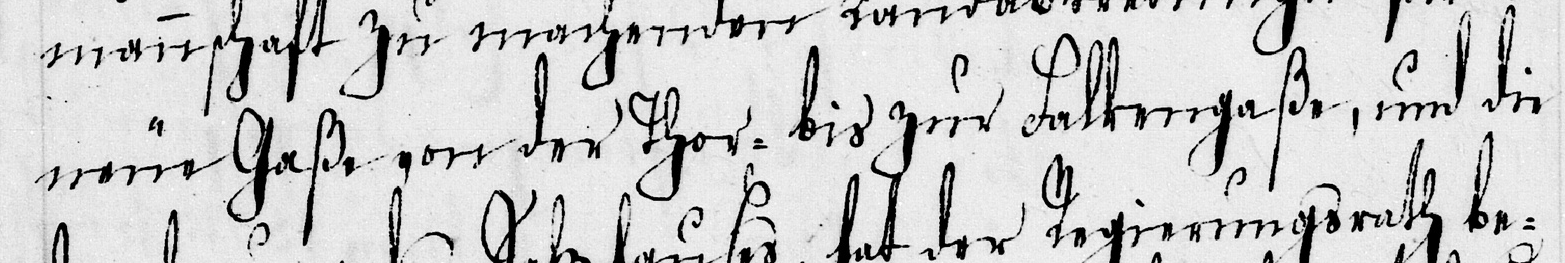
neue Gaße von der Thor- bis zur Falkengaße, und die
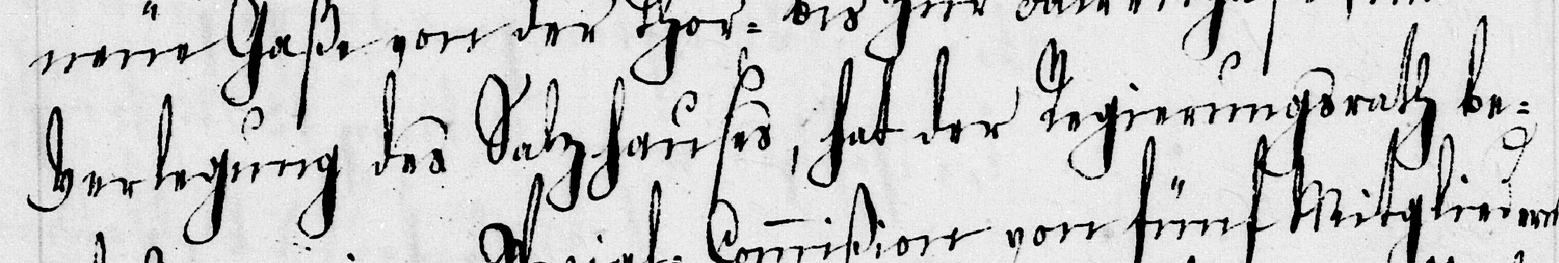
Verlegung des Salzhauses, hat der Regierungsrath be¬
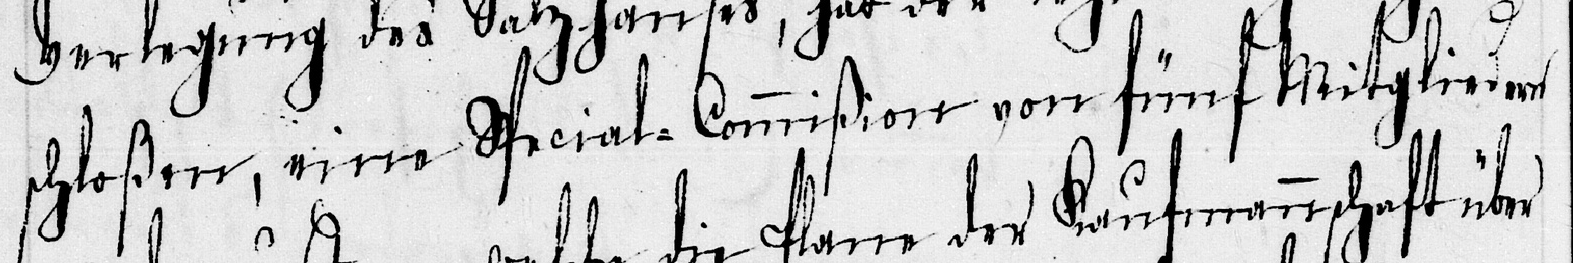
schloßen, eine Special-Commißion von fünf Mitgliedern
